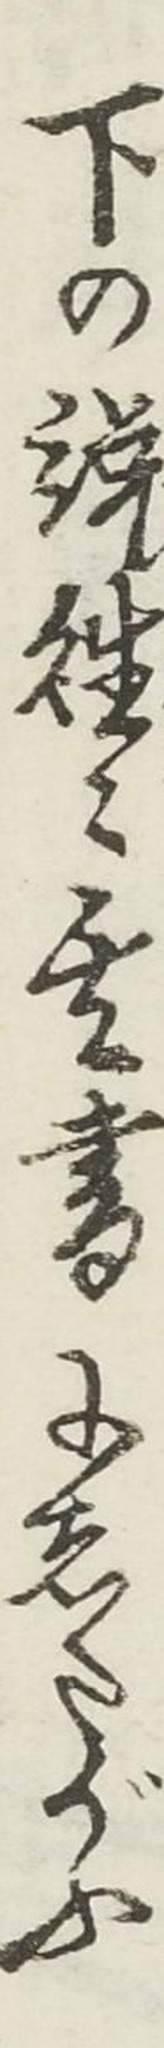下の説往々其書にしたがふ
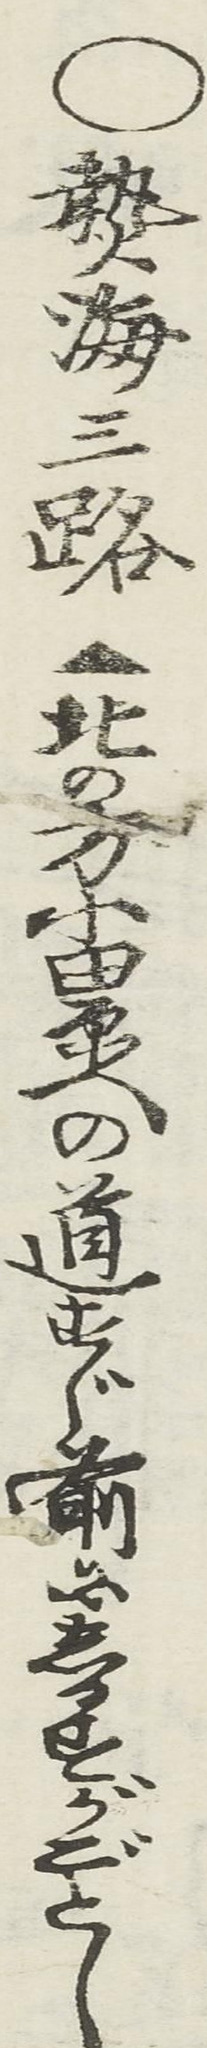○熱海三路▲北の方小田原への道すぐ前にしるすがごとし
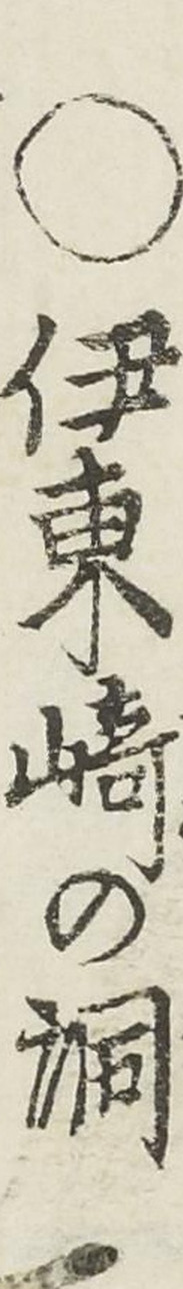○伊東崎の洞
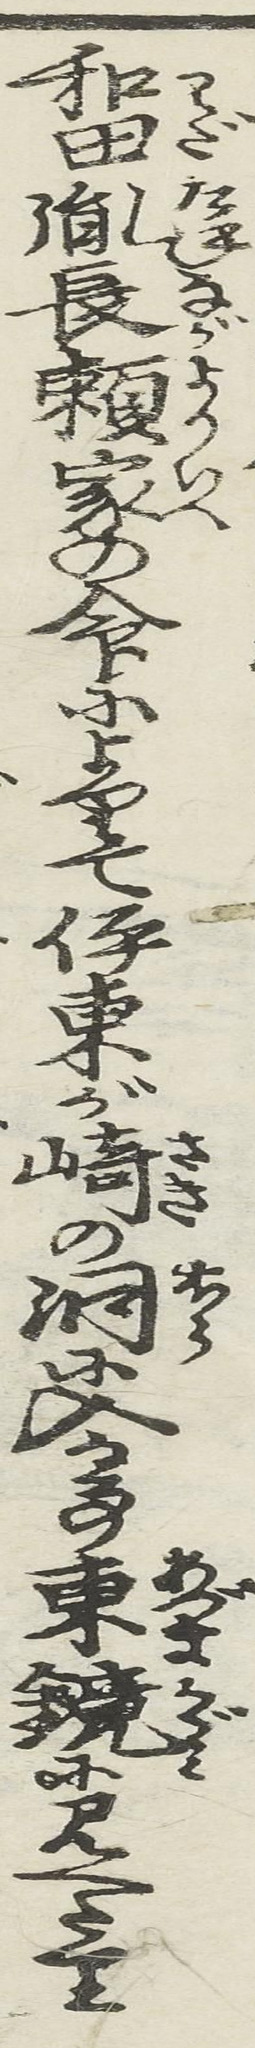和田胤長頼家の命によりて伊東が崎の洞に入る事東鏡に見へたり
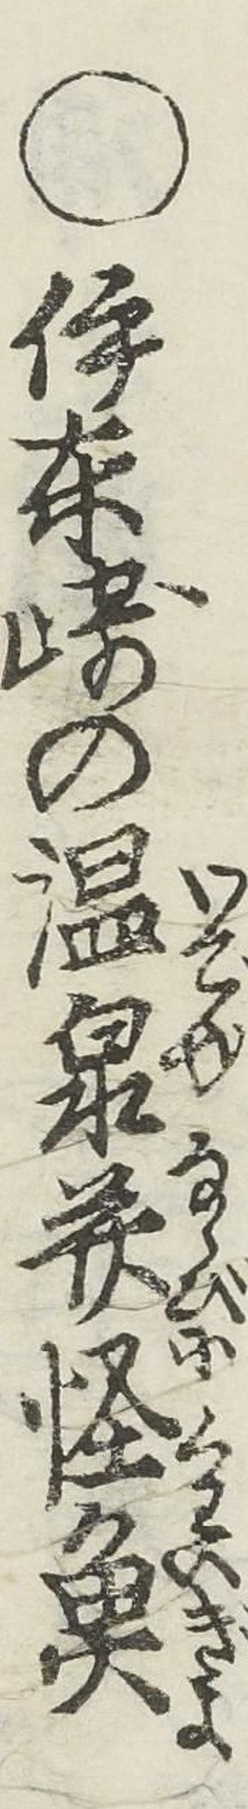○伊東崎の温泉并怪魚
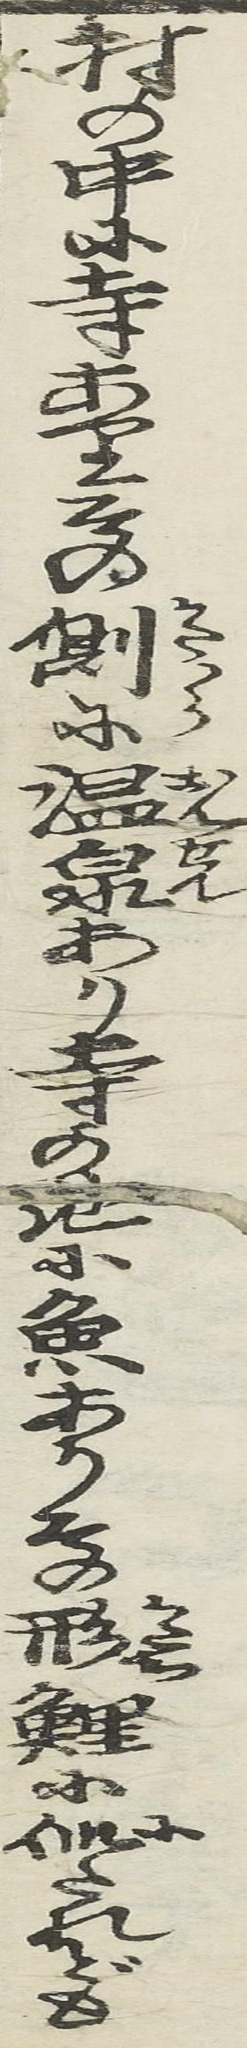村の中に寺ありその側に温泉あり寺の池に魚ありその形鯉に似たれども

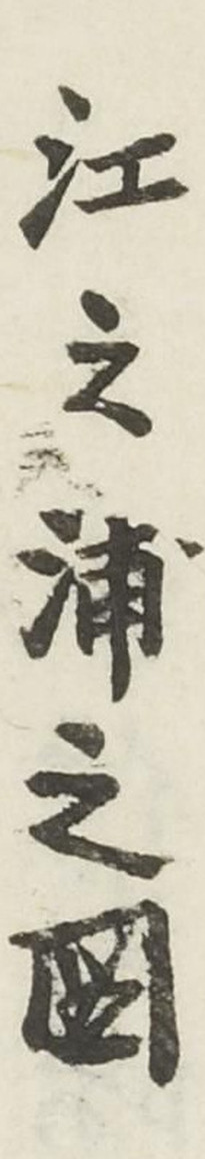江之浦之図
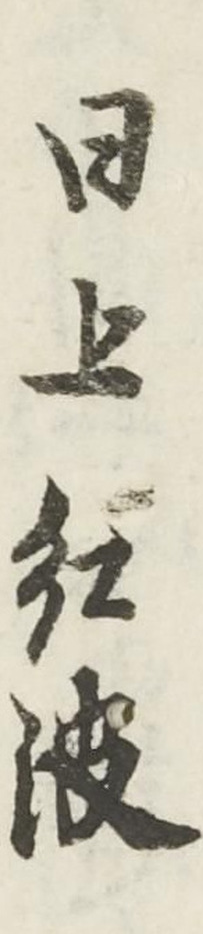日上紅波
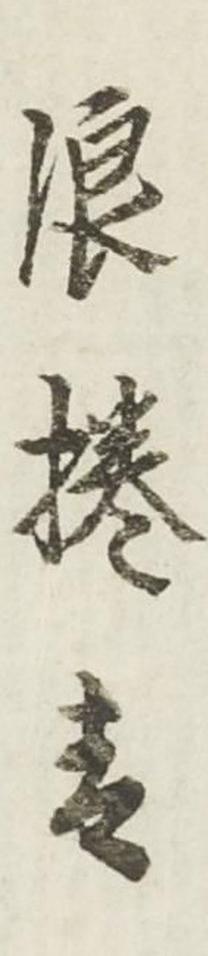浪捲青
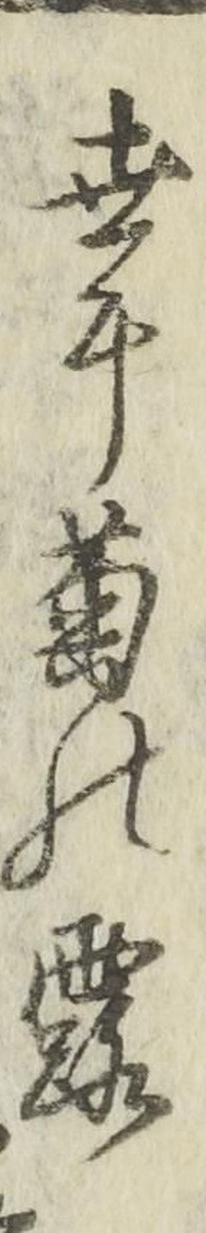世に菊の露には
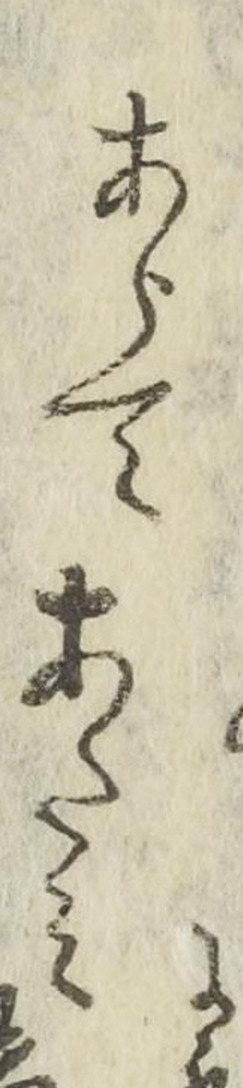あらてあたみ湯は
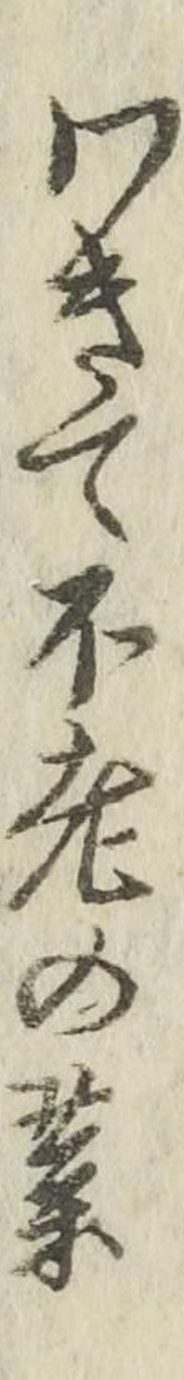わきて不老の薬
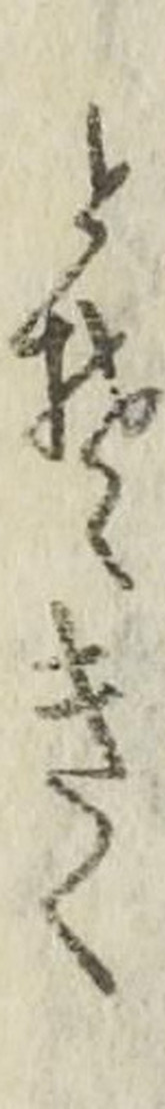とそきく
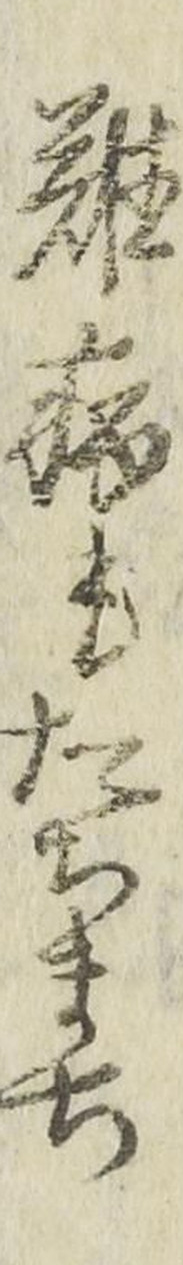難病もたちまち
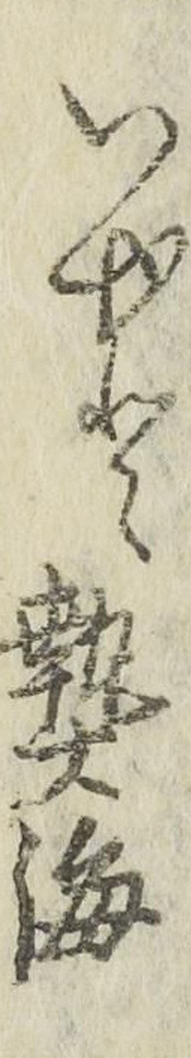いやす熱海
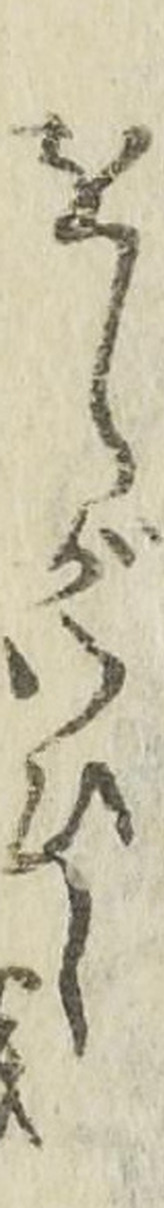をしがいひしを
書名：熱海温泉圖彙
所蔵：東京大学地震研究所図書室 Earthquake Research Institute Library, The University of Tokyo, JAPAN
